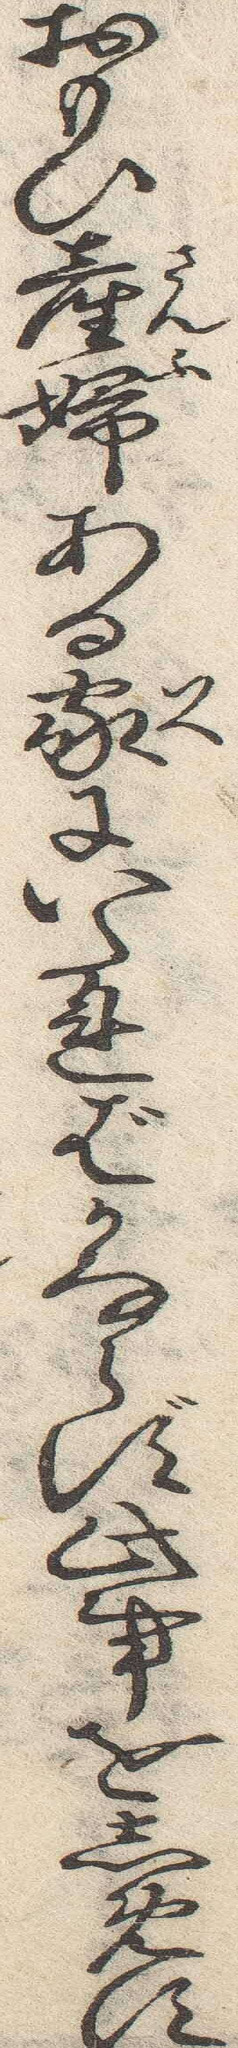おもひ産婦ある家にいたればかならず此事をしめす
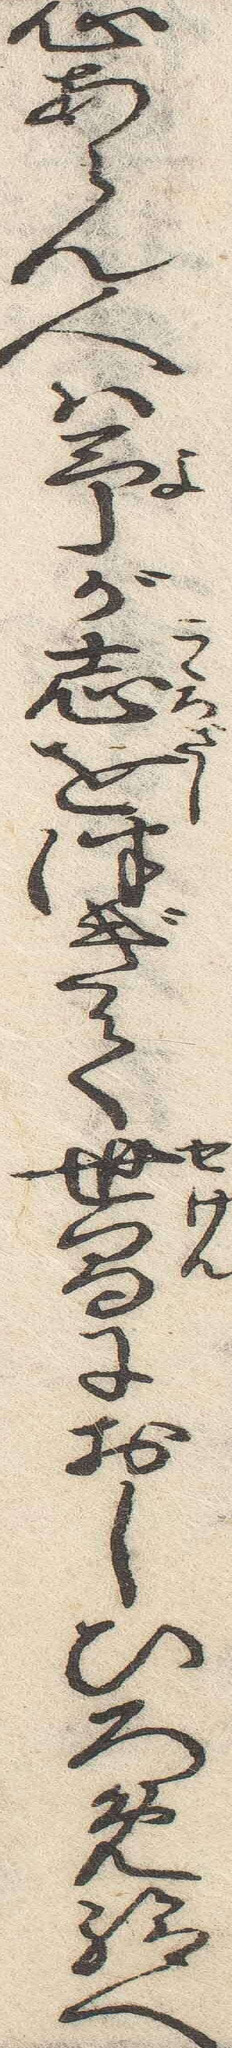心あらん人は予が志をつぎて世間におしひろめ給へ
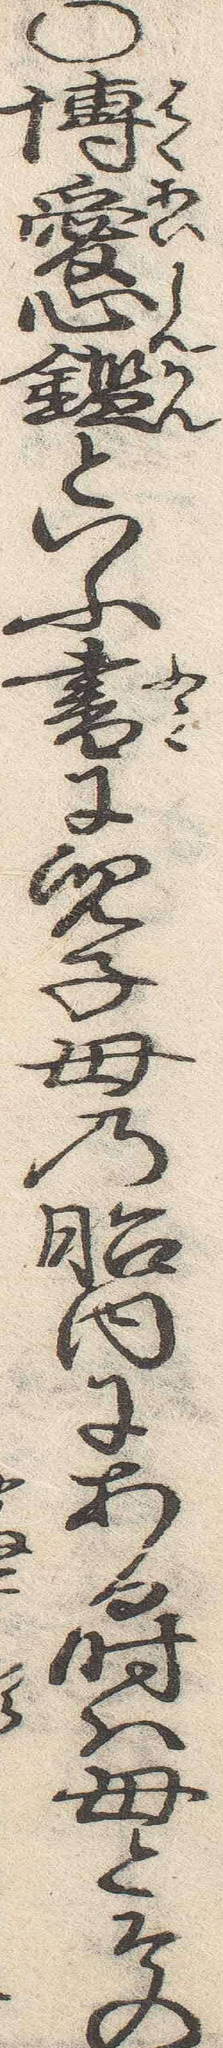◯博愛心鑑といふ書に児子母の胎内にある時は母とその
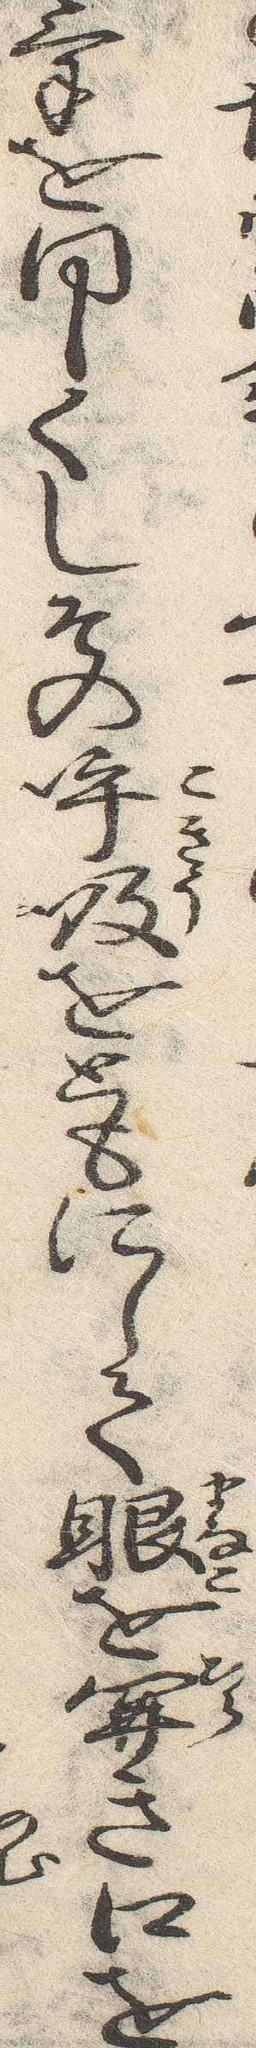氣を同しくしその呼吸をともにして眼を開き口を
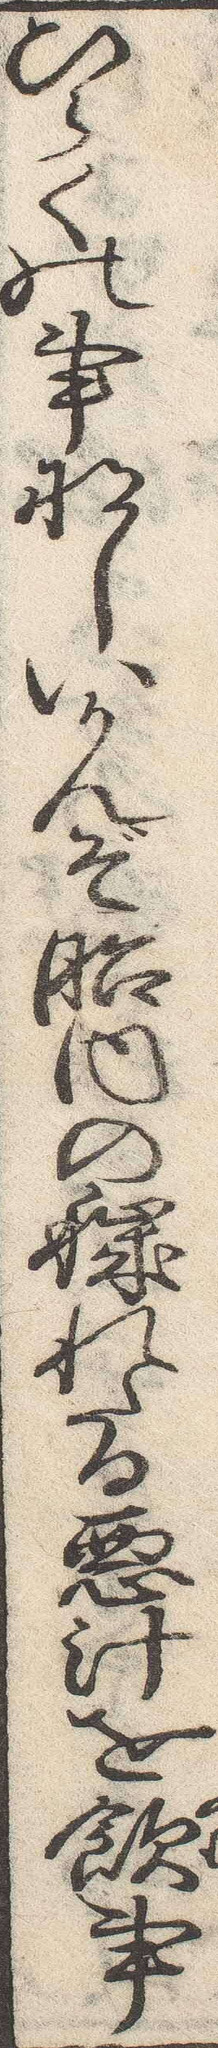ひらくの事なしいかんぞ胎内の穢れたる悪汁を飲事
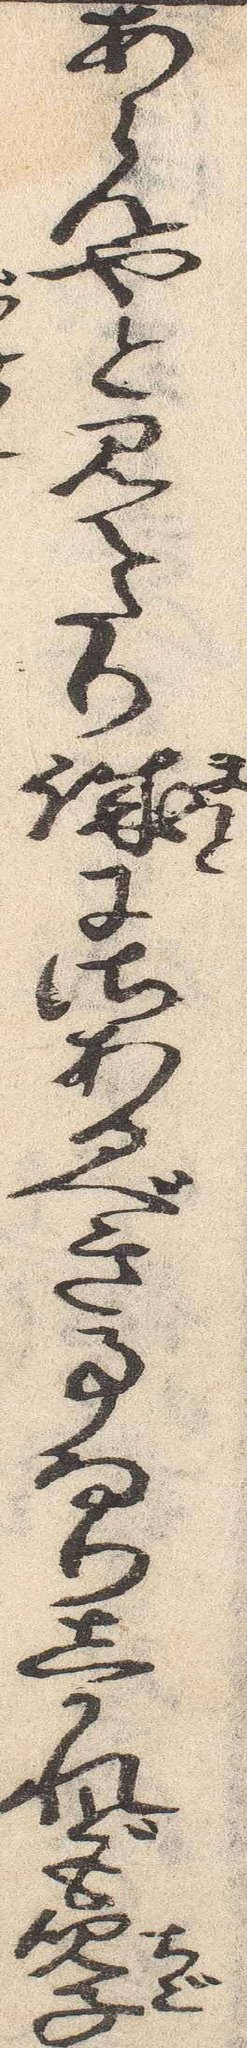あらんやと見えたり誠にさあるべき事なりしかれども児子
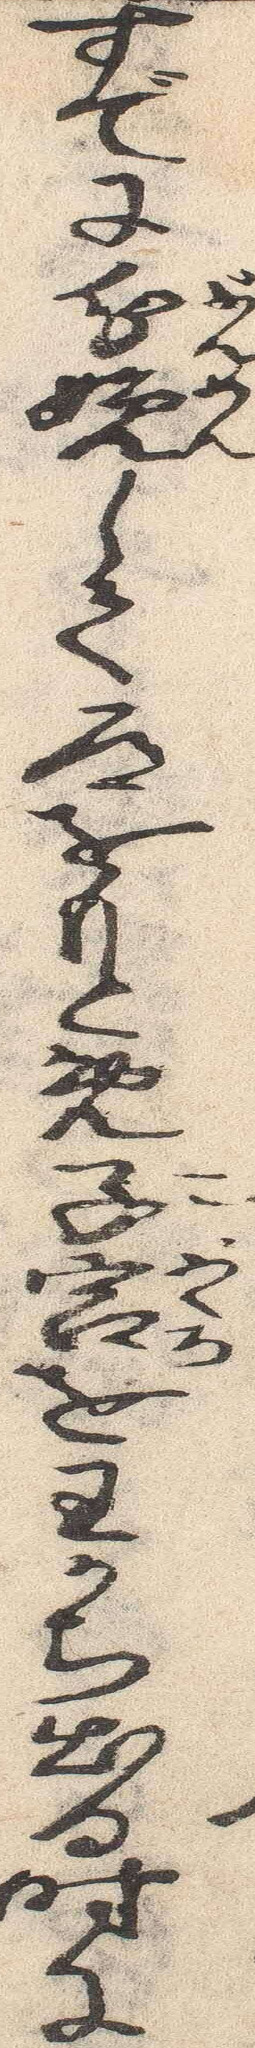すでに分娩して道をもとめ子宮をわかち出る時に
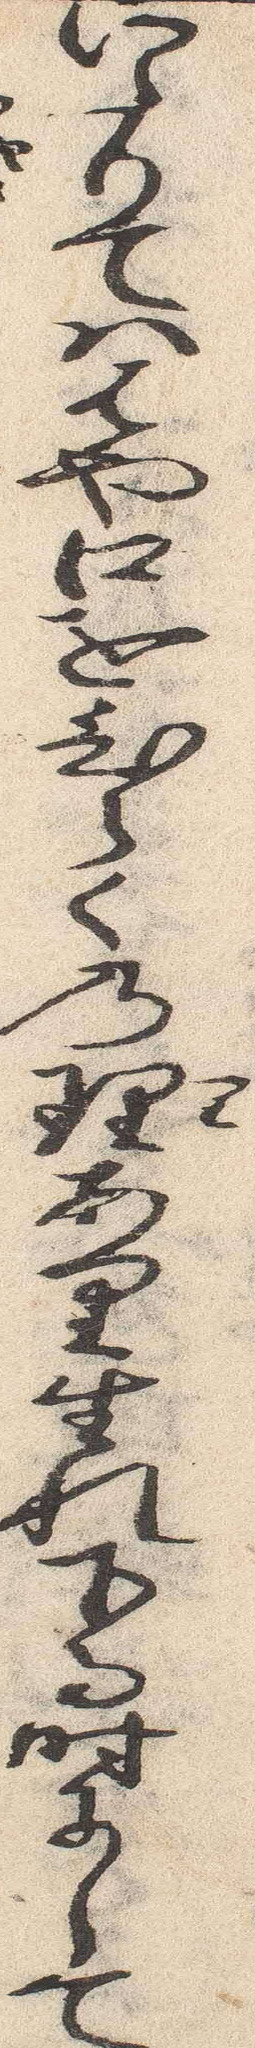いたりてははや口をひらくの理あり生れ下る時にして
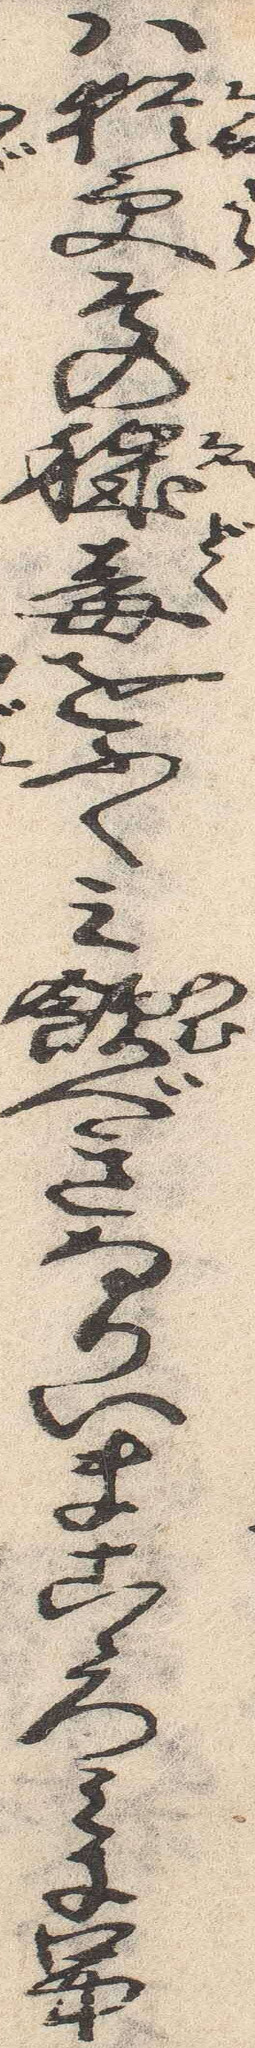は猶更その穢毒をふくみ飲べきなりいまこゝろみに口中
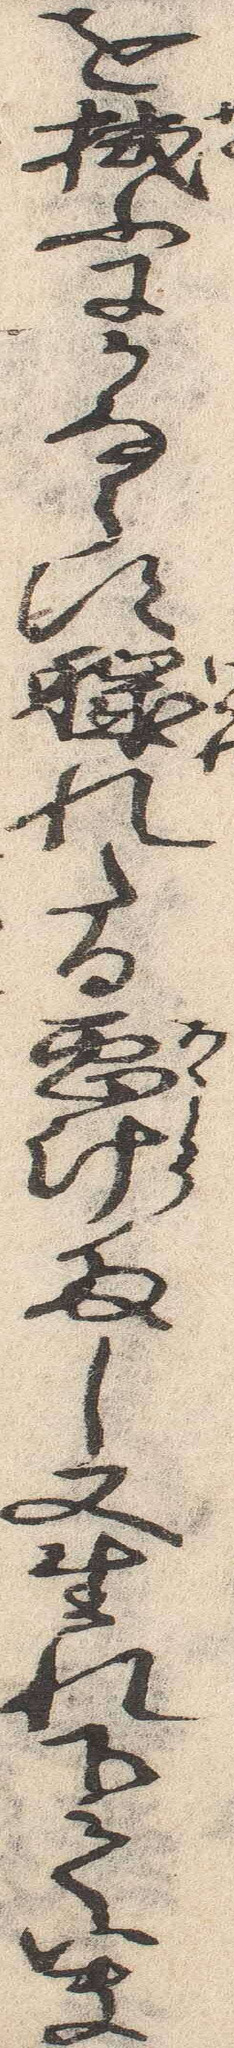を拭ふにかならず穢れたる悪汁多し又生れ下ていま
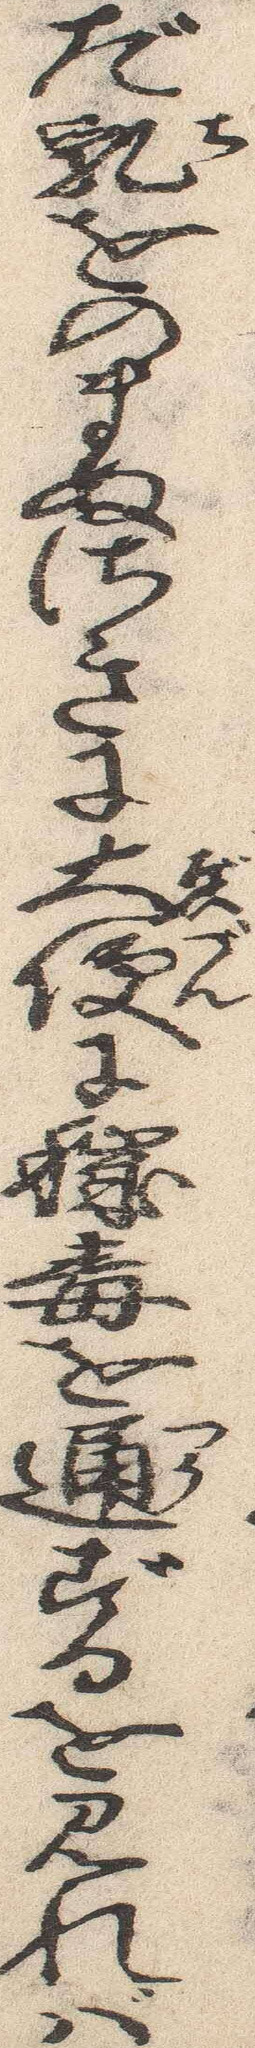だ乳をのまぬさきに大便に穢毒を通ずるを見れば
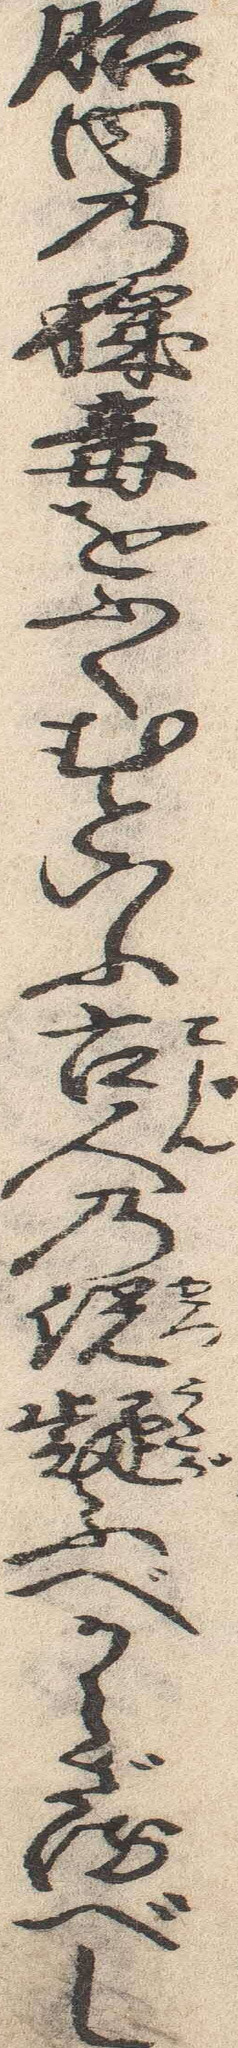胎内の穢毒をふくむといふ古人の説疑ふべからざるべし
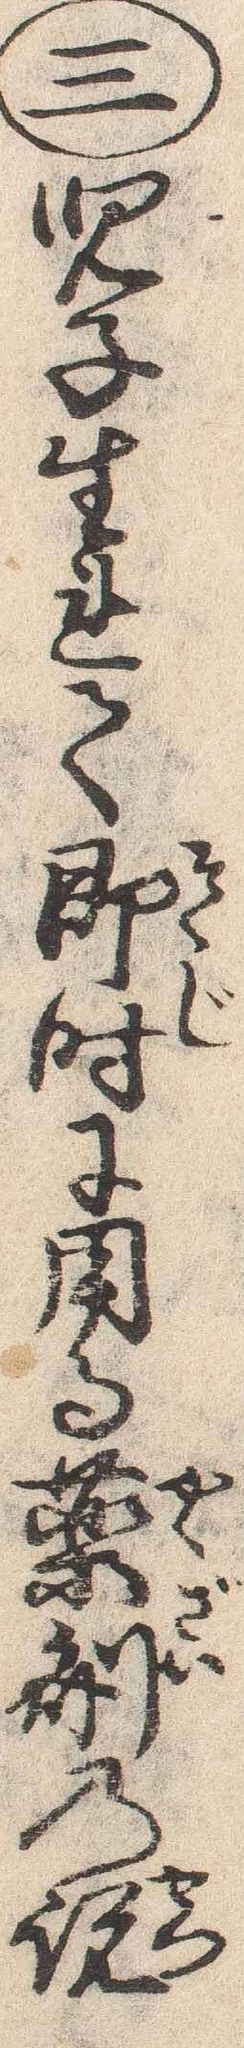㊂児子生れて即時に用る薬剤の説
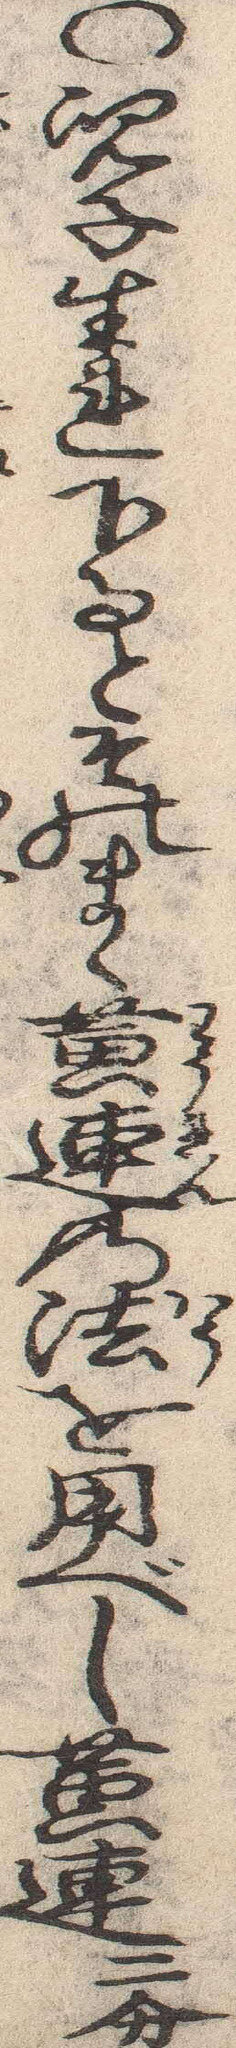◯児子生れ下るとそのまゝ黄連の法を用べし黄連二分
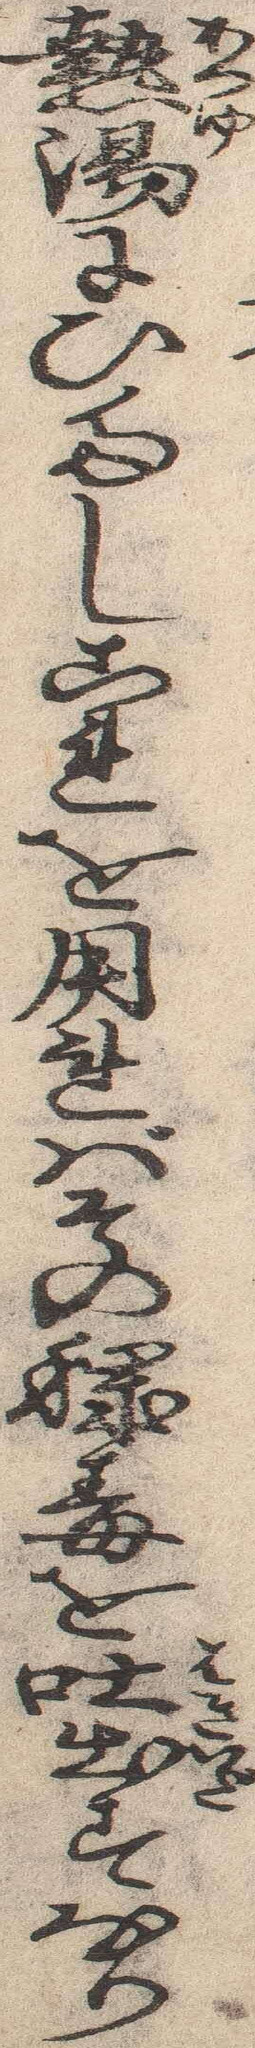熱湯にひたしこれを用ればその穢毒を吐出すなり

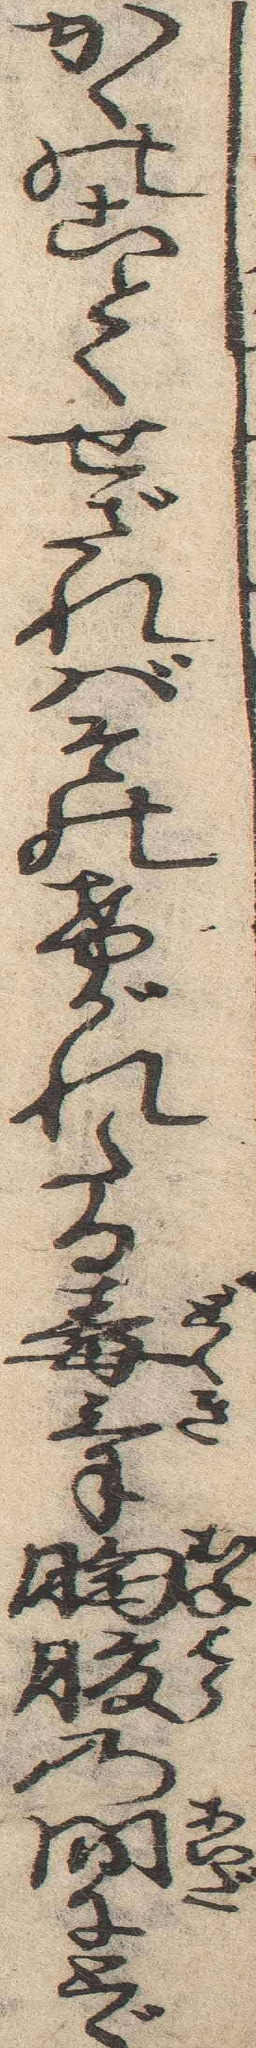かくのことくせざればそのけがれたる毒氣胸腹の間にとゞ
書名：小児必用養育草
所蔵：東京学芸大学附属図書館 国文学研究資料館
